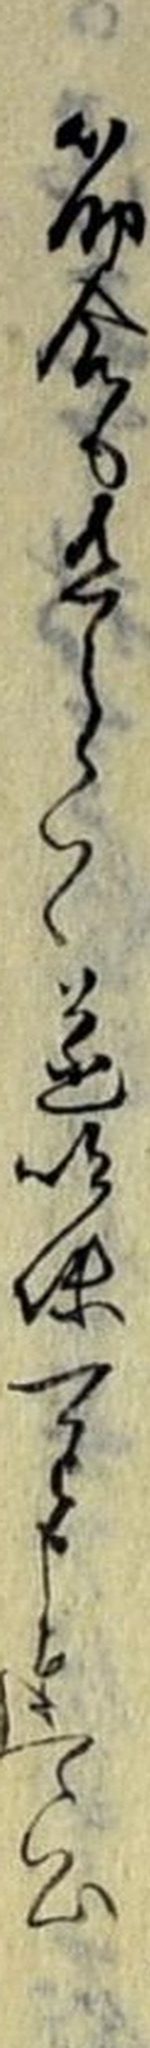筋合も有之候はゝ遂吟味可被申達候以上
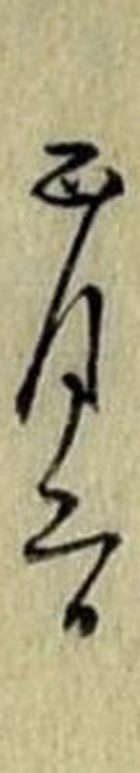正月二日
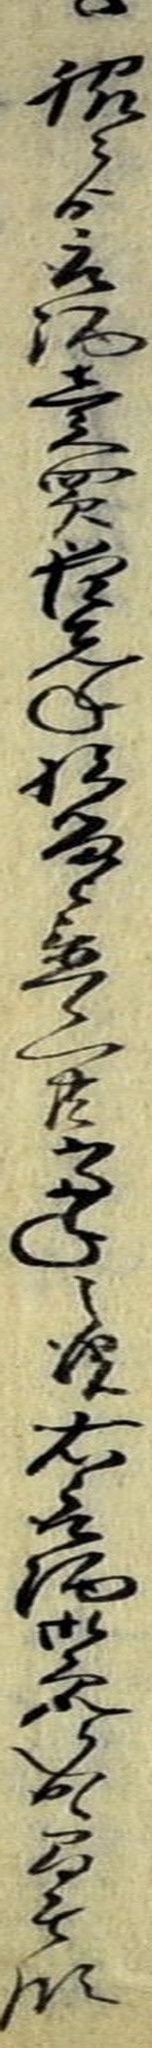〇脇々ゟ取酒売買従先年指留被置候へ共当年之儀は右取酒御受被成候間其段
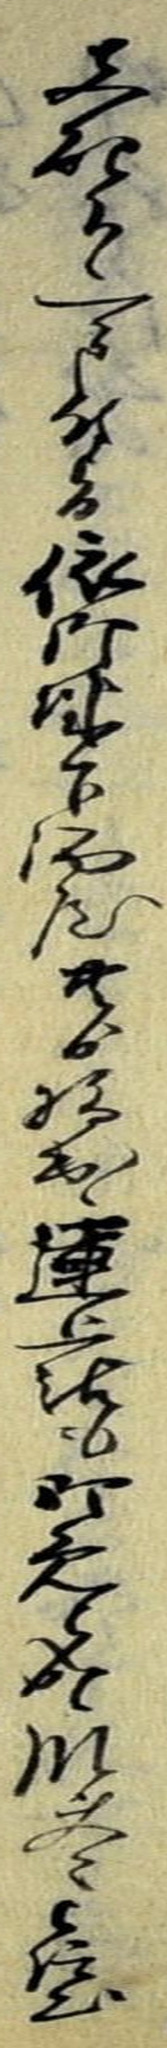支配下へ可申付旨依御城下酒屋共ゟ指出候運上銀も御免被成候段夫々被仰出
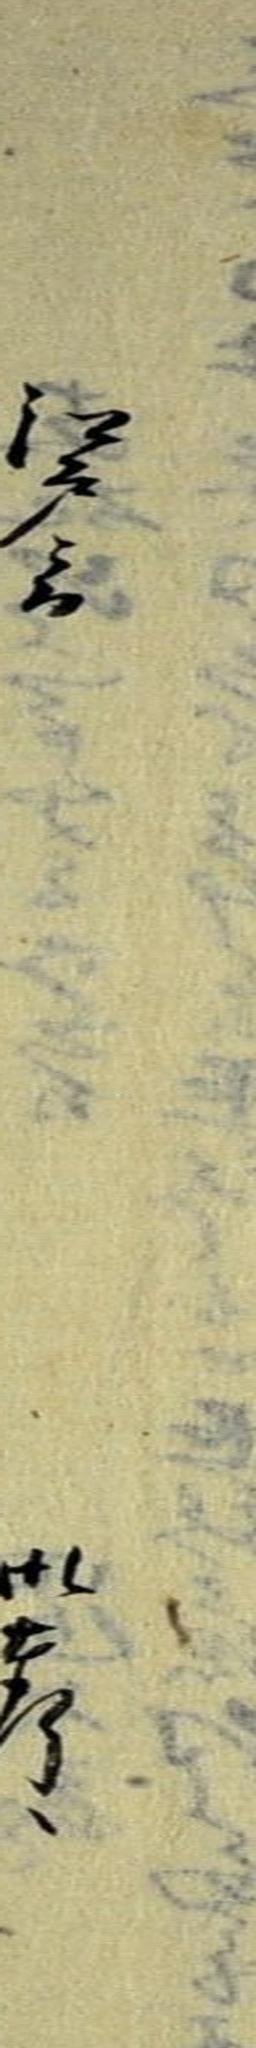江戸に而御奉行へ
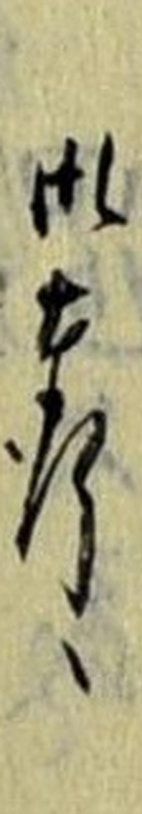御奉行へ
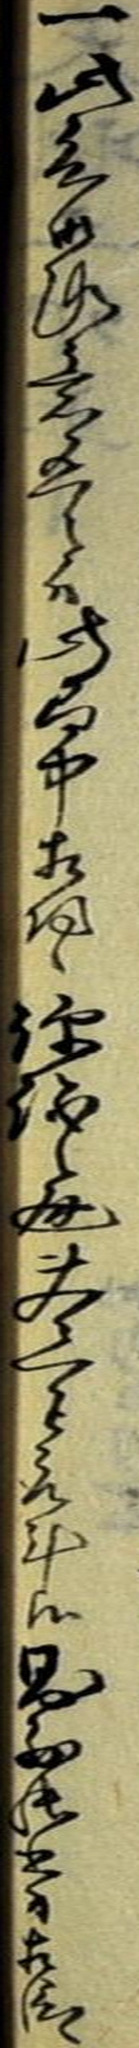一此度御趣意有之に付此間中相伺候評議之通夫々可被取斗候則別紙書付相渡候
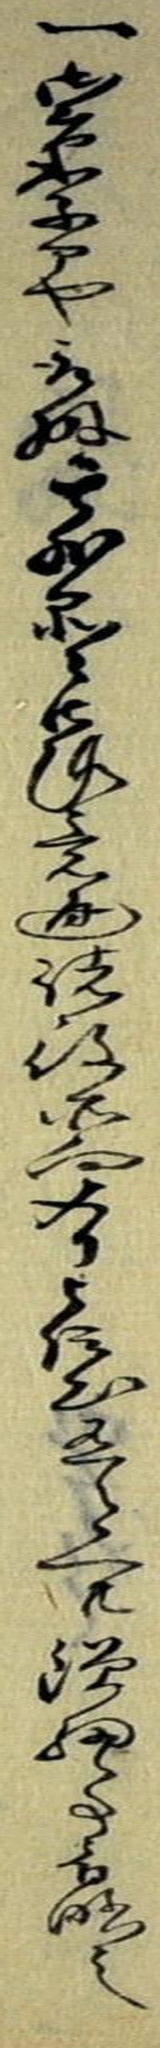一御菓子部や取扱其外品々御趣意通諸役所向〆り被仰出有之候へ共鎖細之事に付略之
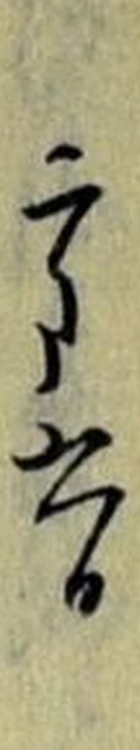二月六日
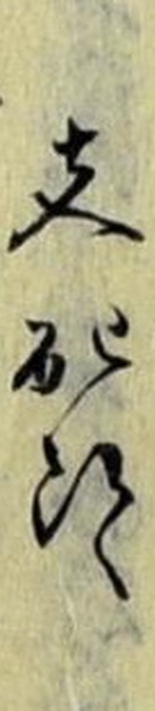支配頭へ
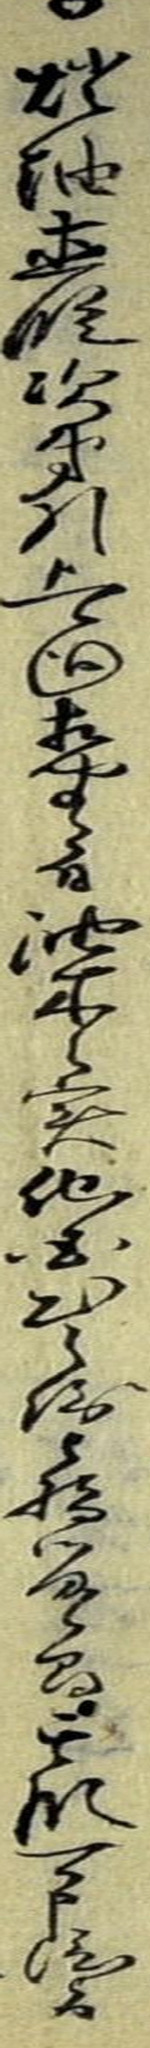〇燈油直段次第引上候趣相聞候に付油木之実他国出之儀被指留候間其段可申渡旨
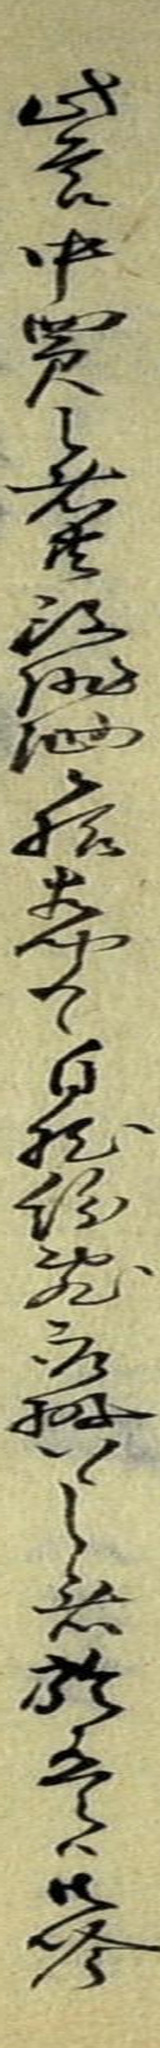此節中買之者共致徘徊候様相聞候自然紛敷取扱いたし者於有之は御吟
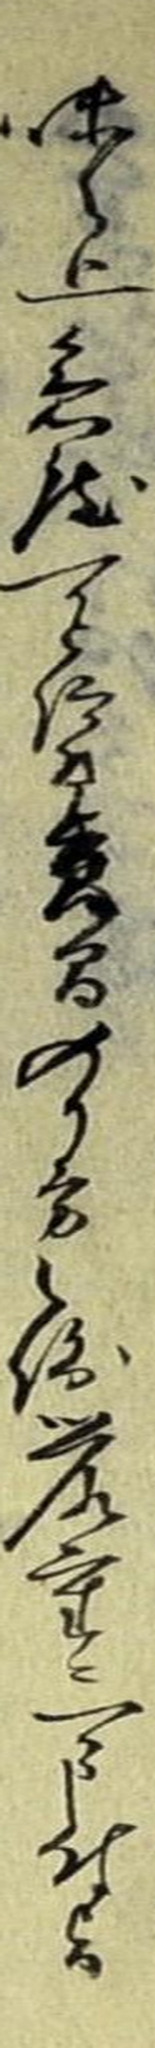味之上急度可被仰付旨候間〆り方之儀厳重に可申付旨
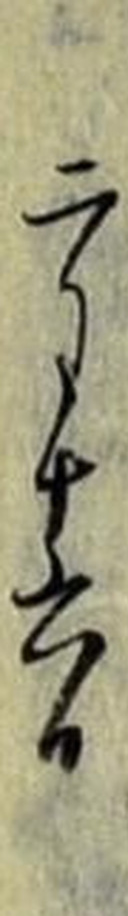二月十六日
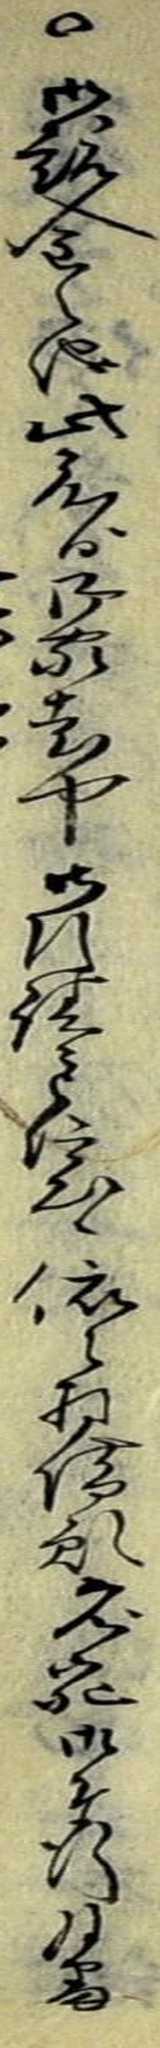〇御趣金之儀此度ゟ御家老中御引請に被仰出候依之拝借願名宛御奉行月番
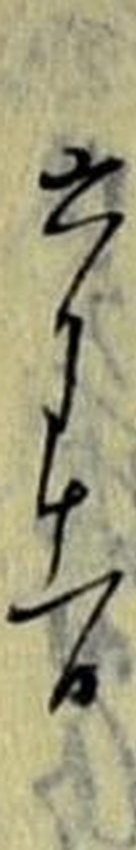六月十一日
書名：命令之部 二
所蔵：福井県文書館 Fukui Prefectural Archives
